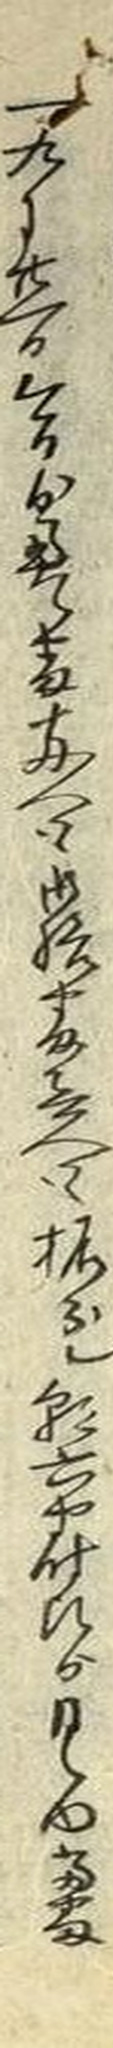一九月廿一日今日ゟ奥之番両人ツヽ御膳番壱人ツヽ振分レ朝六半時頃ゟ日之内当番
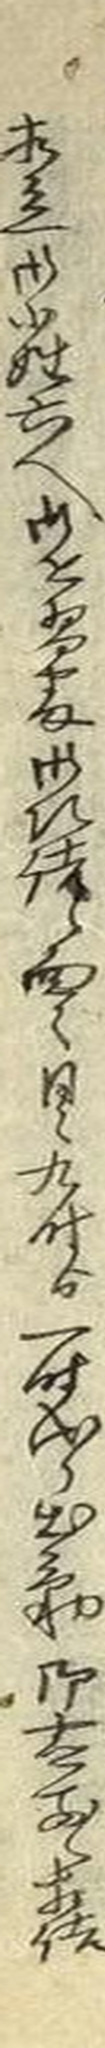相立御小姓六人御近習番御次詰之面々日々九時ゟ一時代り出勤御霊前相詰
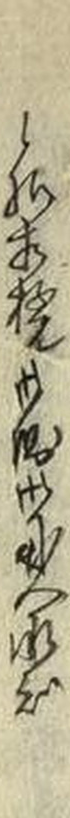候様相極ル御側御用人承知
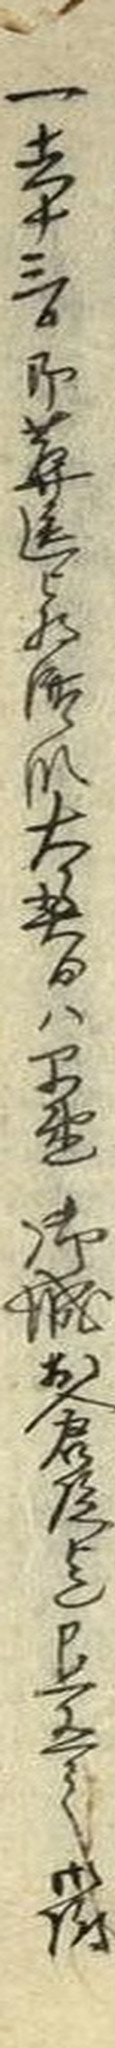一去十三日御葬送日被為済候段大奥ゟハ早速御城お倉殿迄申上有之御附
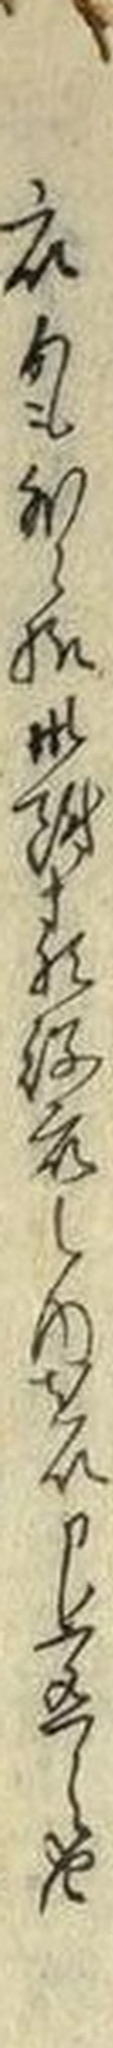衆ゟも外之様御附類役衆之内を以申上有之由
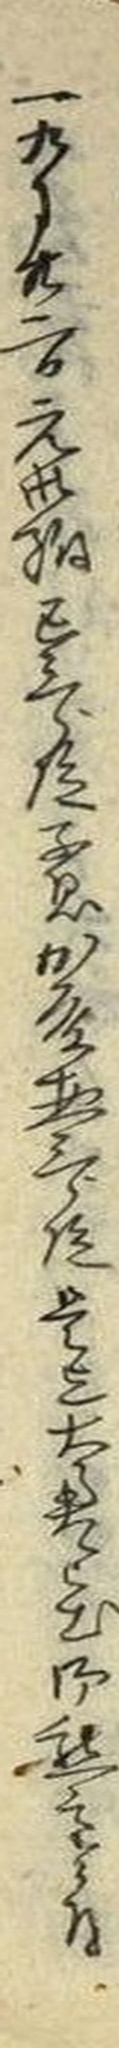一九月廿二日元御附巳三郎殿子息加藤惣三郎殿是迄大奥へ被出御懇意ニ付

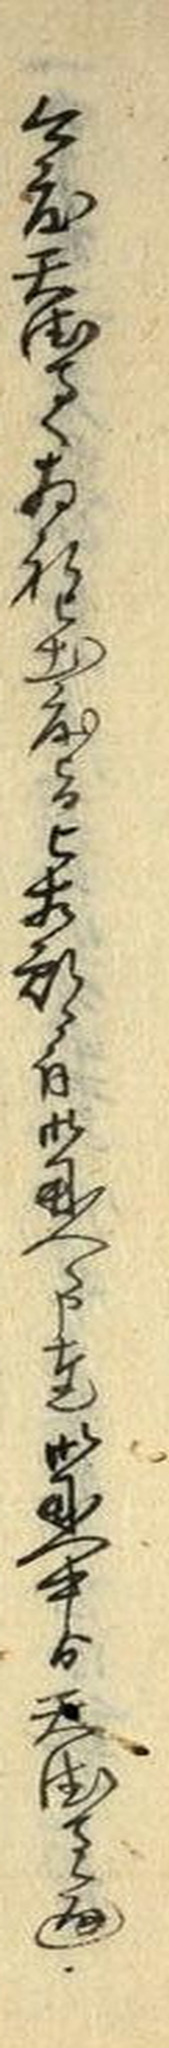今度天徳寺へ拝礼被出度旨被相願候ニ付御用人へ申達御用人中ゟ天徳寺へ通
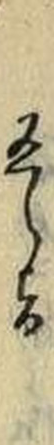有之旨
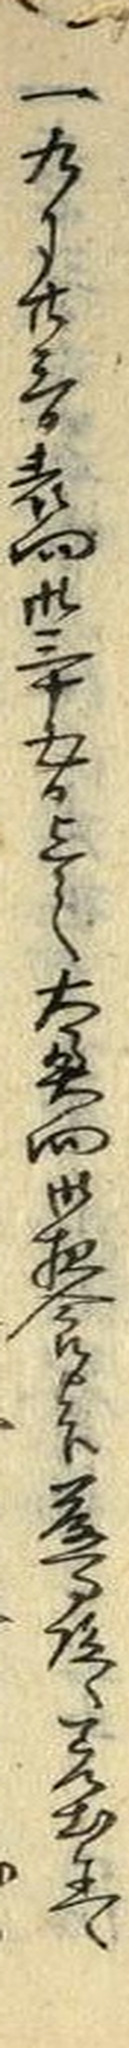一九月廿三日表向御三十五日迄之大奥向御夜食被下藤馬殿へ差出置候
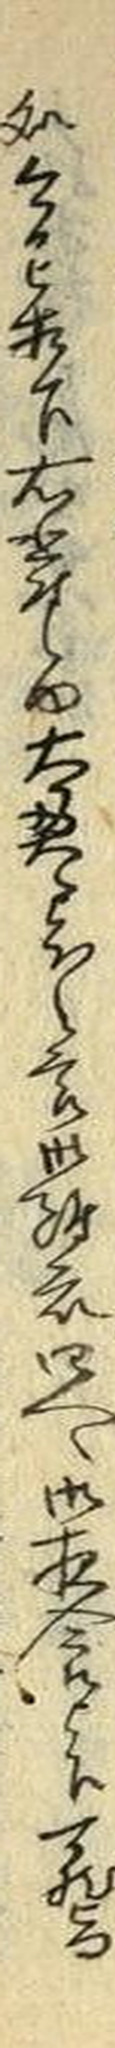処今日被相下右書付之内大奥被下之節御附衆四人へ御夜食被下可然旨
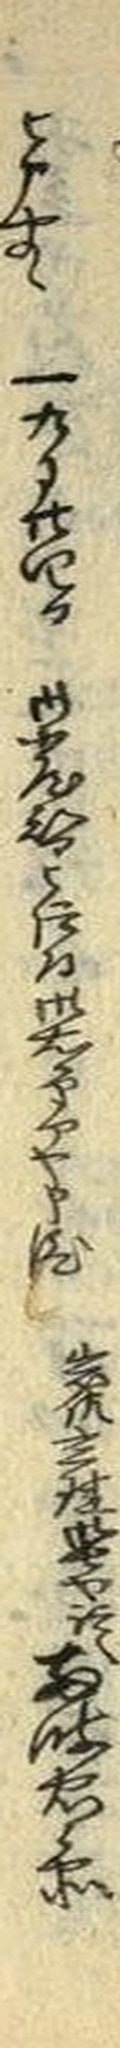被申聞候一九月廿四日御小屋替被仰付御右筆部や申渡岩佐玄珪御長屋跡へ前波忠兵衛
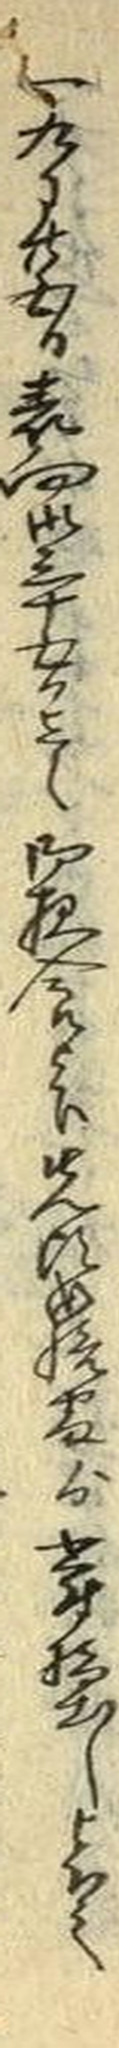一九月廿五日表向御三十五日迄之御夜食被下先頃御膳番ゟ書付指出被下之
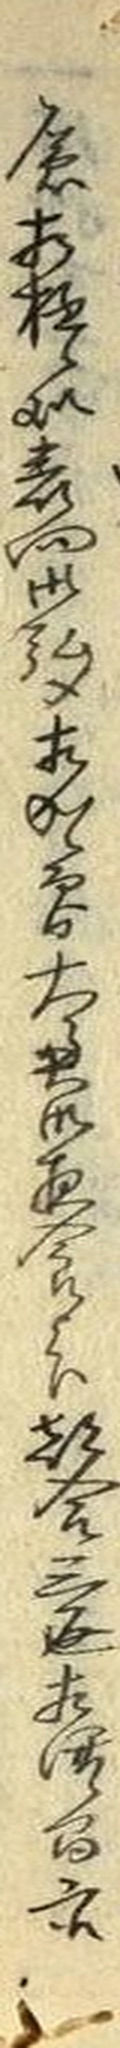廉相極候処表向御弘メ相成候而ゟ大奥御夜食被下都合三通相済候間最
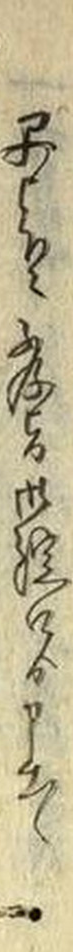早被下ニ不及旨御錠口ゟ申出候
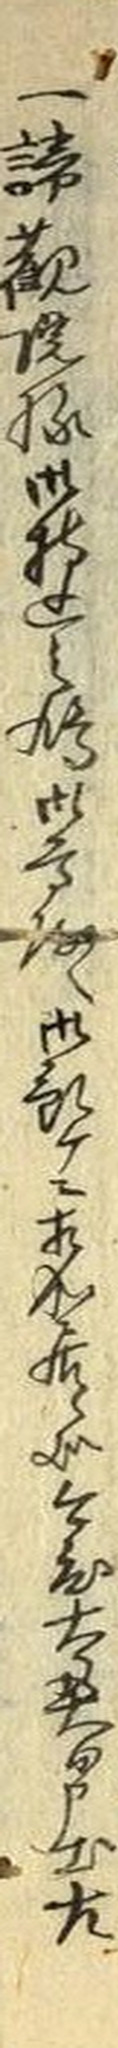一諦観院様御持込之鳩御馬屋へ御預ヶニ相成居候処今度大奥ゟ申出左
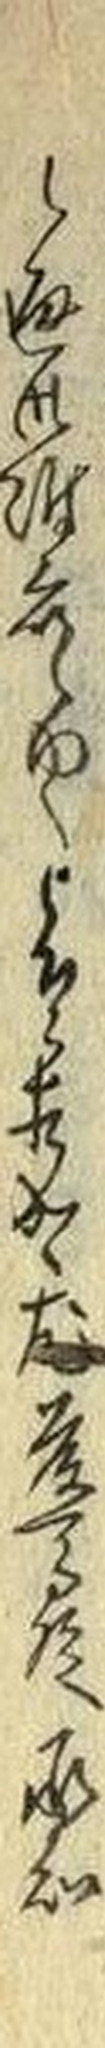之通御附衆之内へ被下之相成候尤藤馬殿承知
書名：少傅日録抄（斉善付側向頭取日記、江戸并道中、初入在国、逝去後…
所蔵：福井県文書館 Fukui Prefectural Archives
